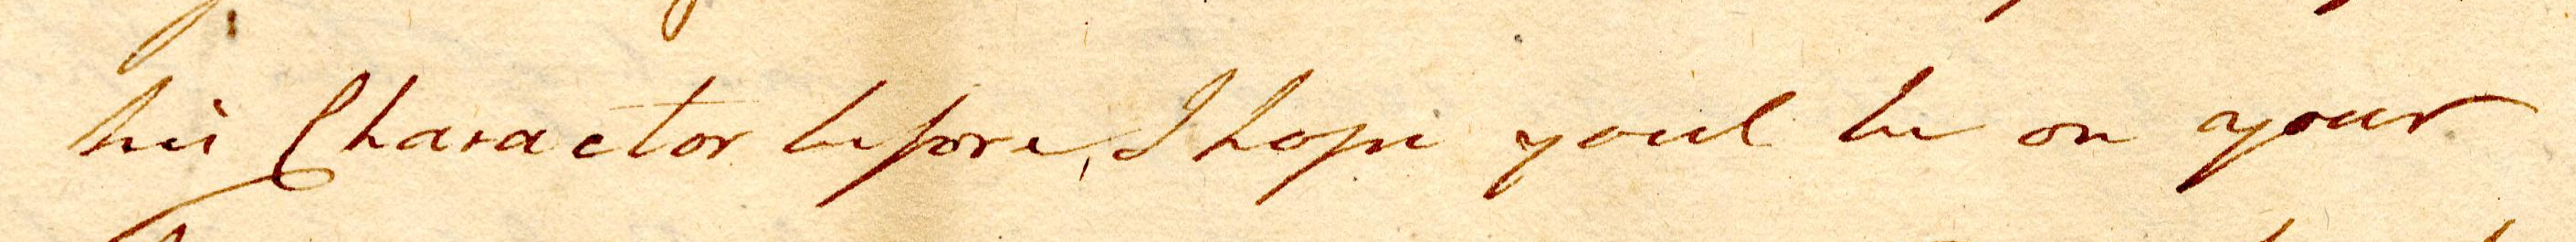his Character before, I hope youl be on your.
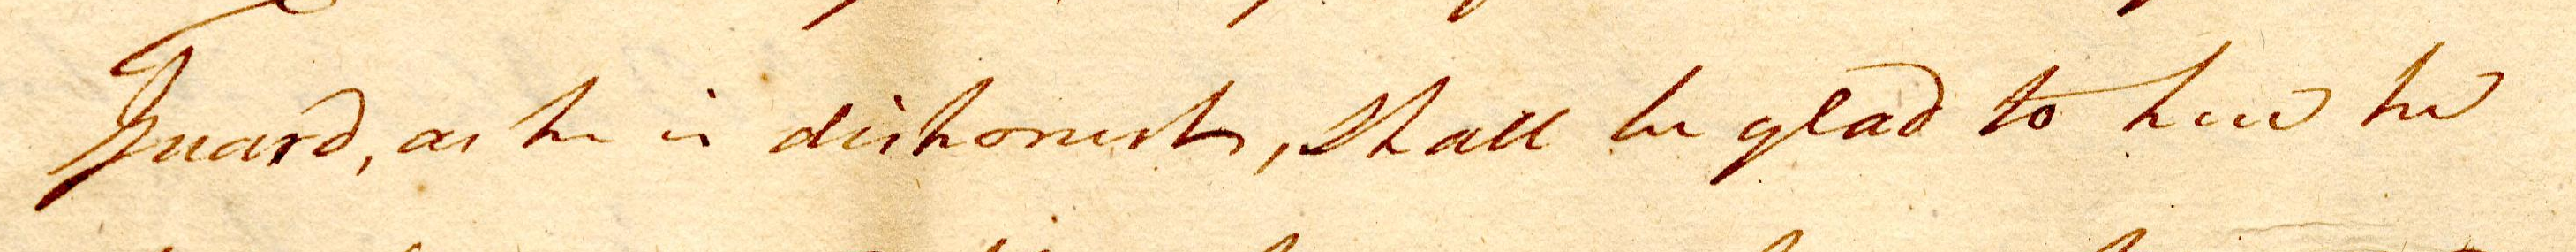guard, as he is dishonest, shall be glad to here he
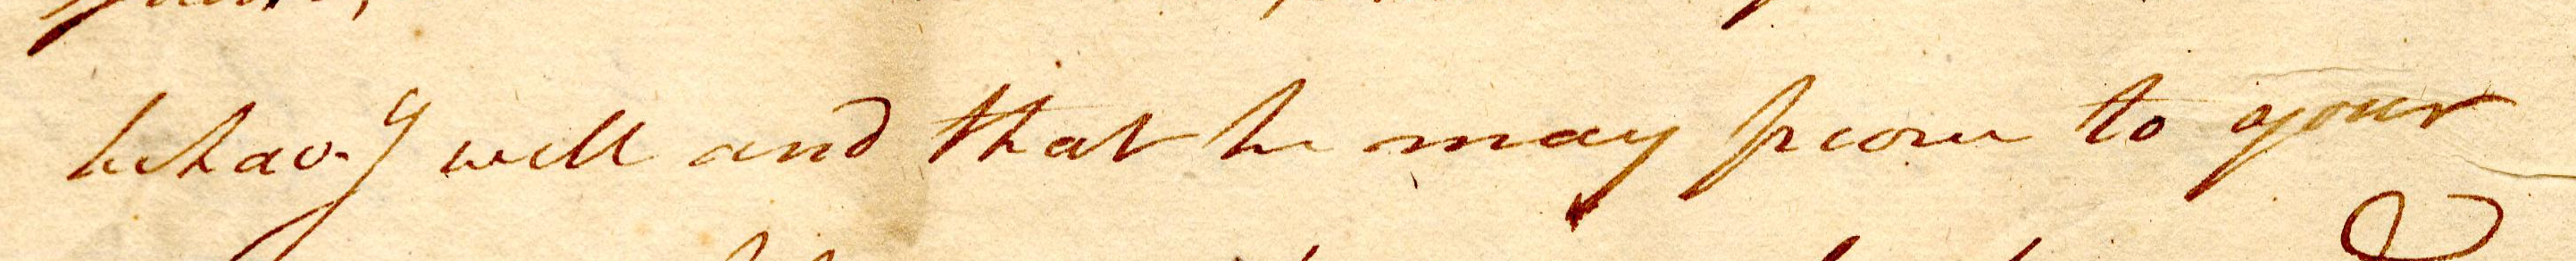behav^g. Well and that he may prove to your
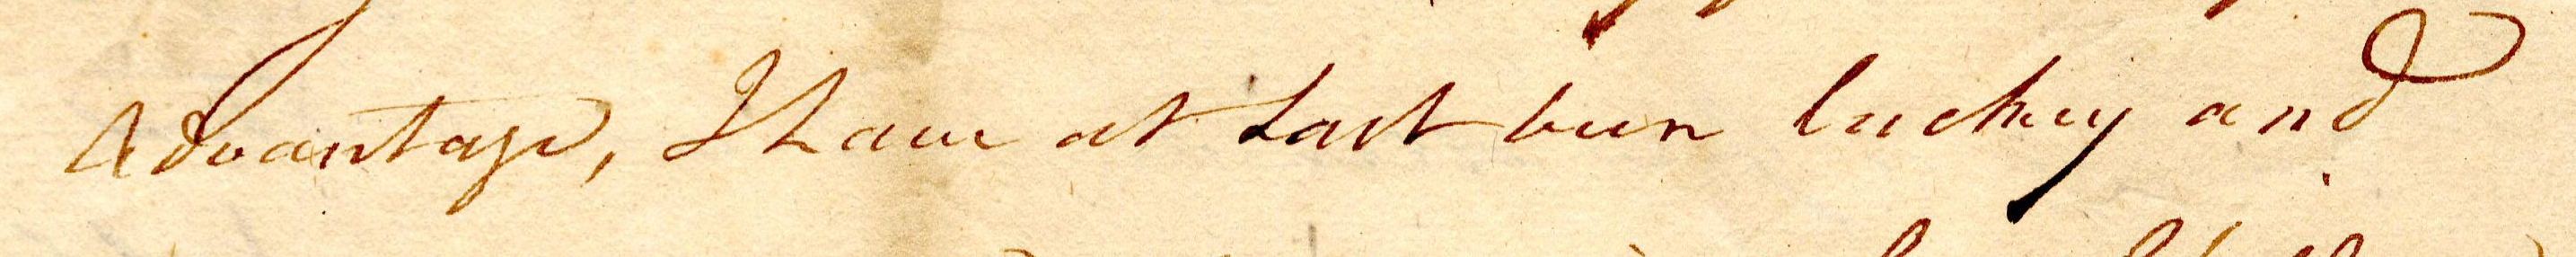Advantage, I have at Last been luckey and
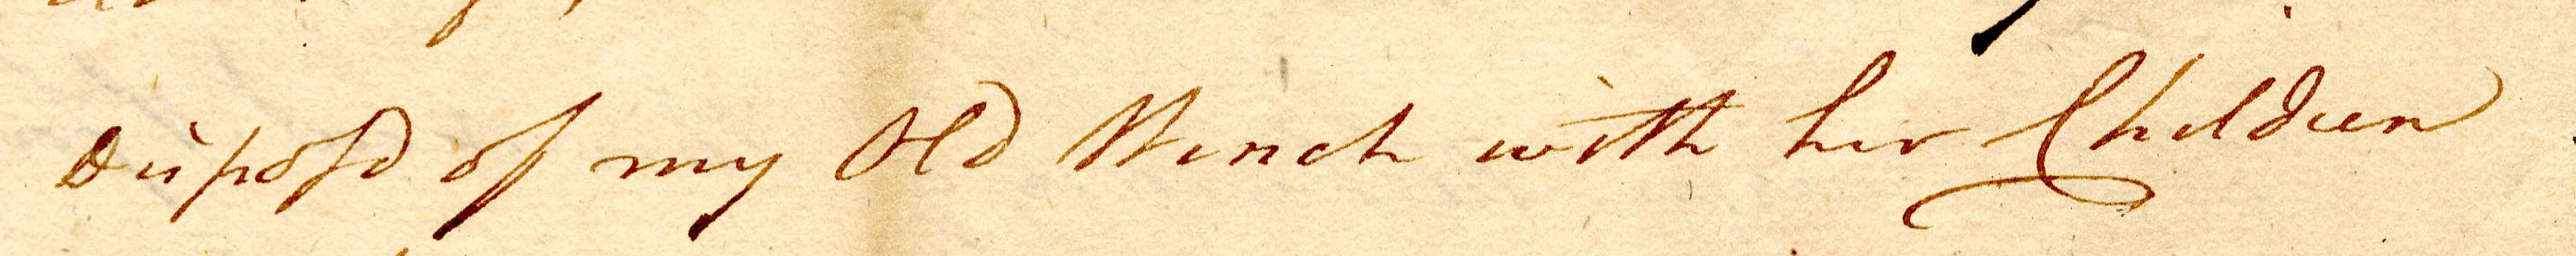Disposd of my Old Wench with her Children
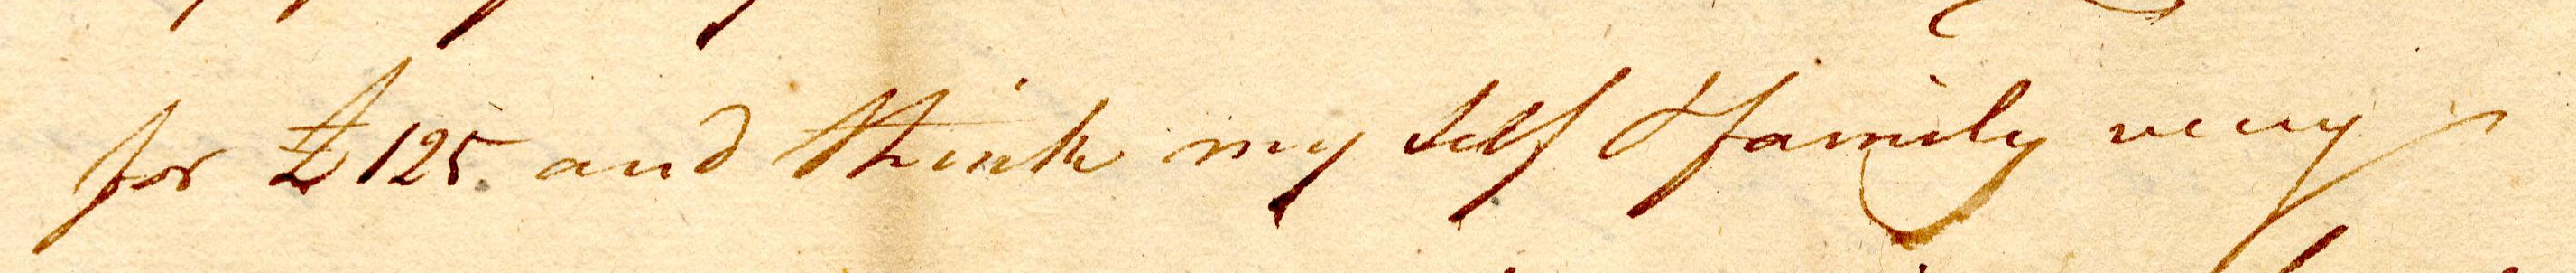for £125 and think my self & family very
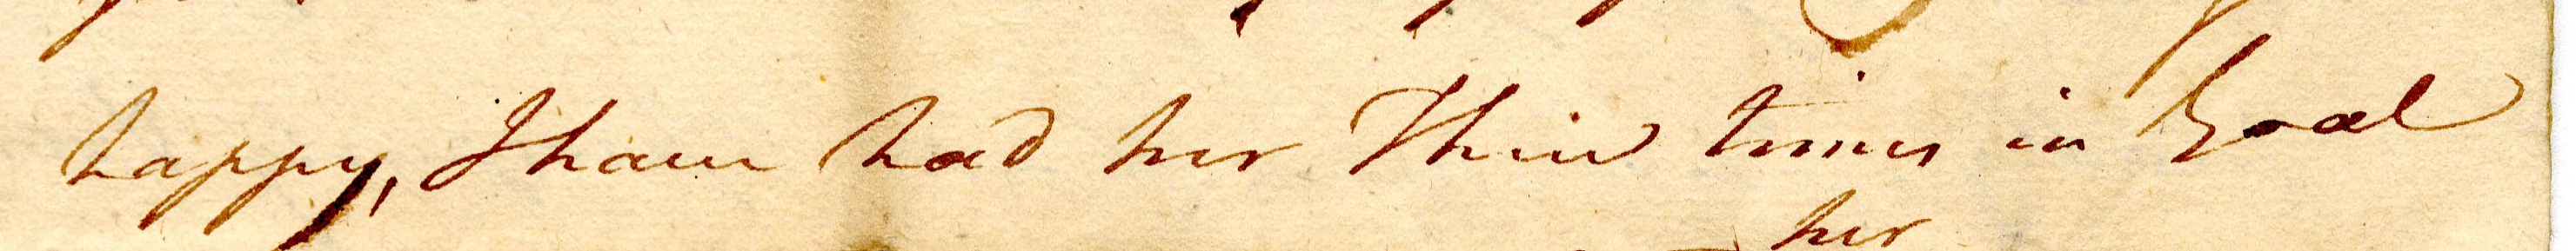happy, I have had her three times in Goal
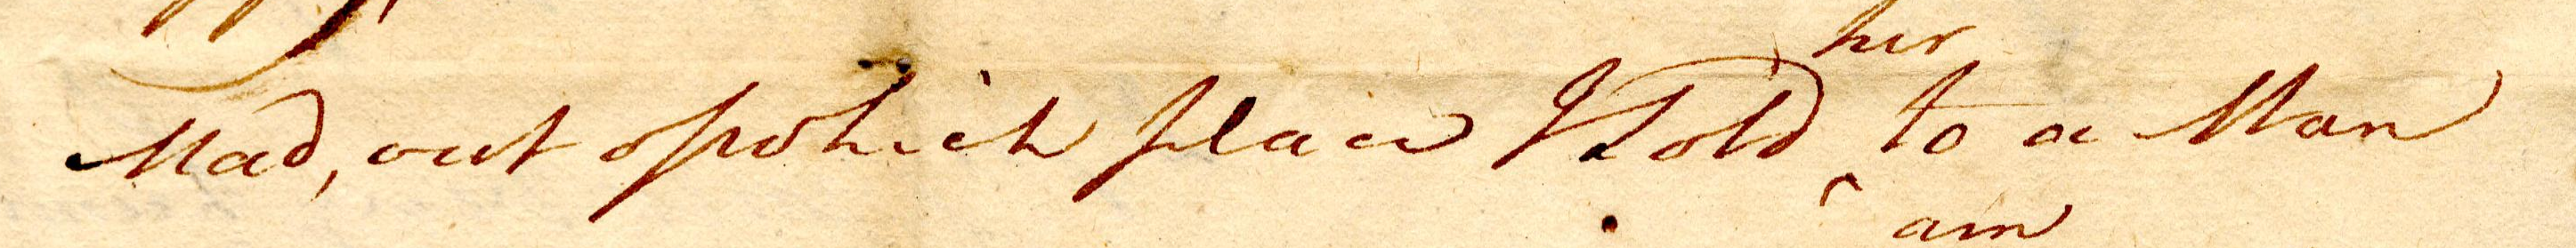Mad, out of which place I sold ^ to a Man
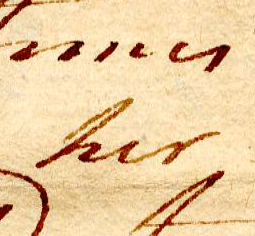her
